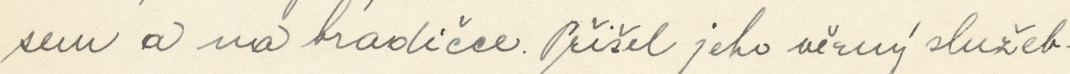sem a na bradičce. Přišel jeho věrný služeb-
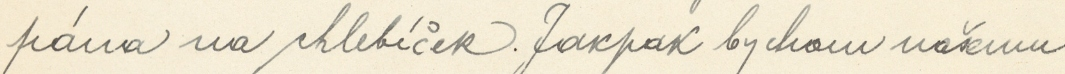pána na chlebíček. Jakpak bychom našemu
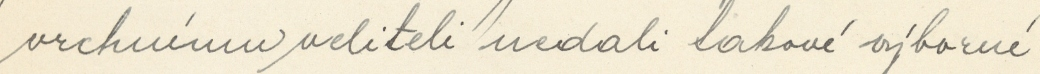vrchnímu veliteli nedali takové výborné
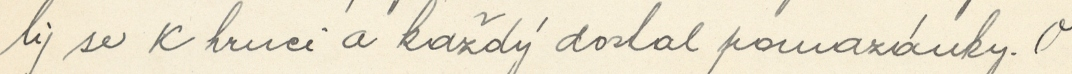li se k hrnci a každý dostal pomazánky. O
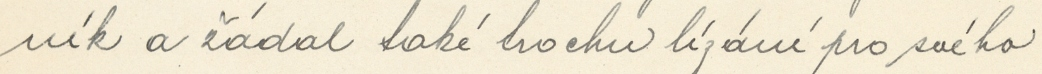ník a žádal také trochu lízání pro svého
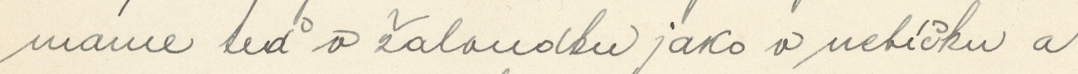máme teď v žaludku jako v nebíčku a
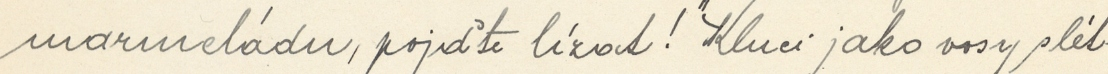marmeládu, pojďte lízat!“ Kluci jako vosy slét-
